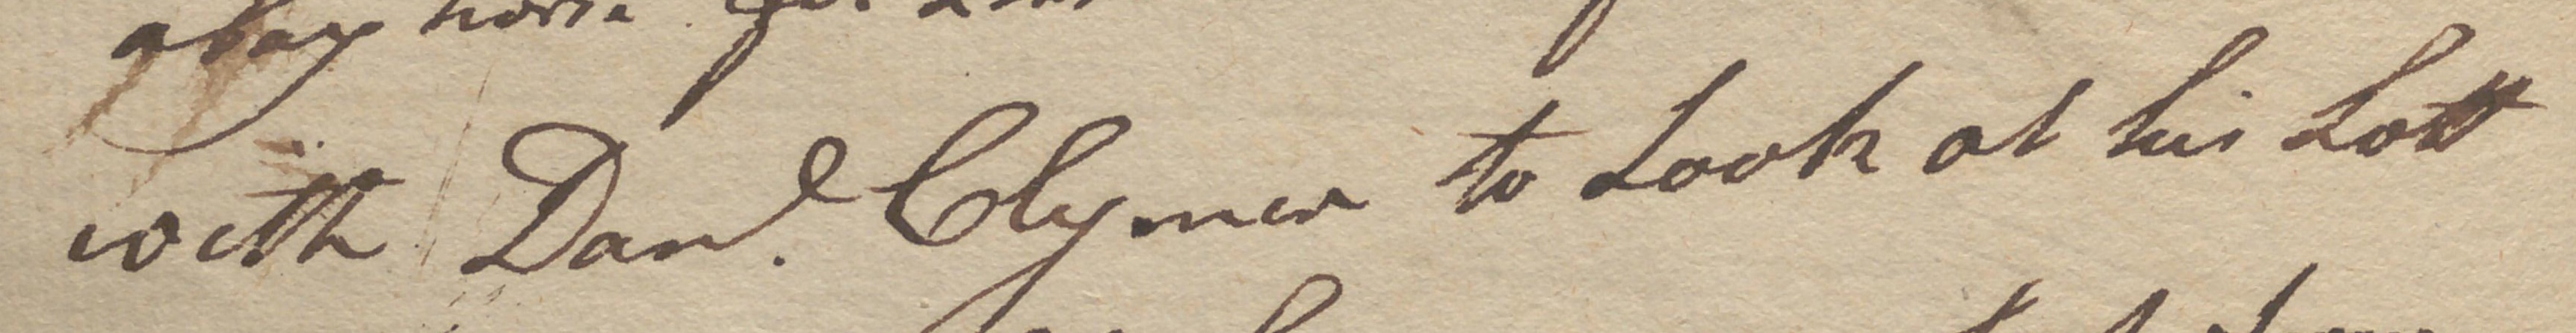with, Dan^l. Clymer to Look at his Lott
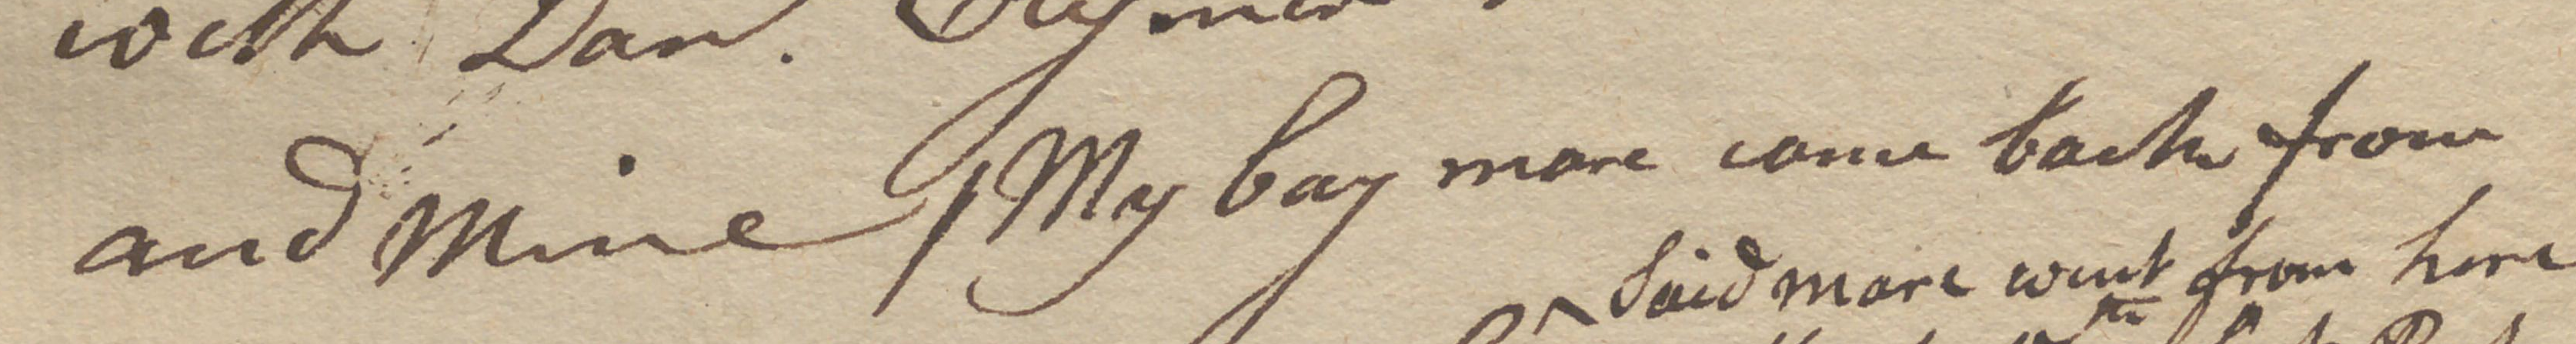and Mine, My bay mare came back from
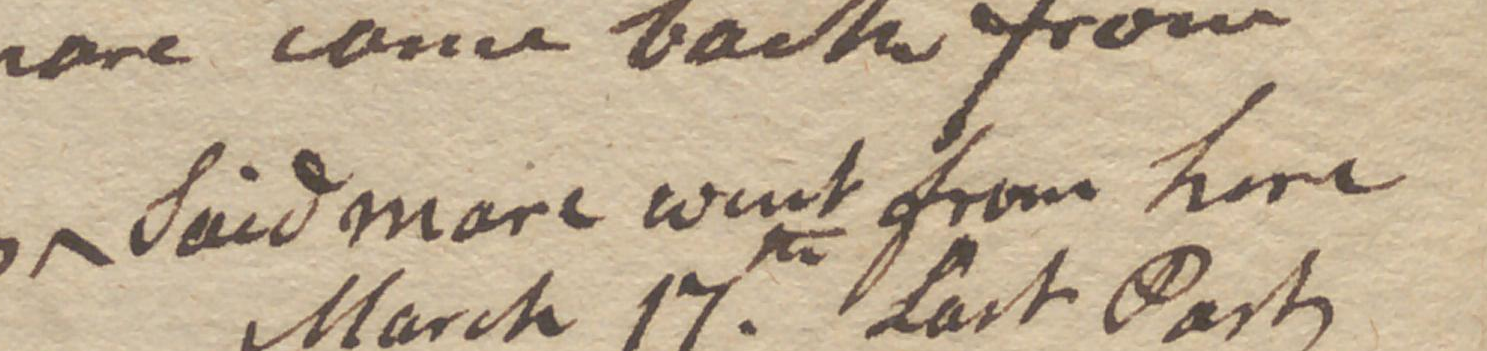Said mare went from here
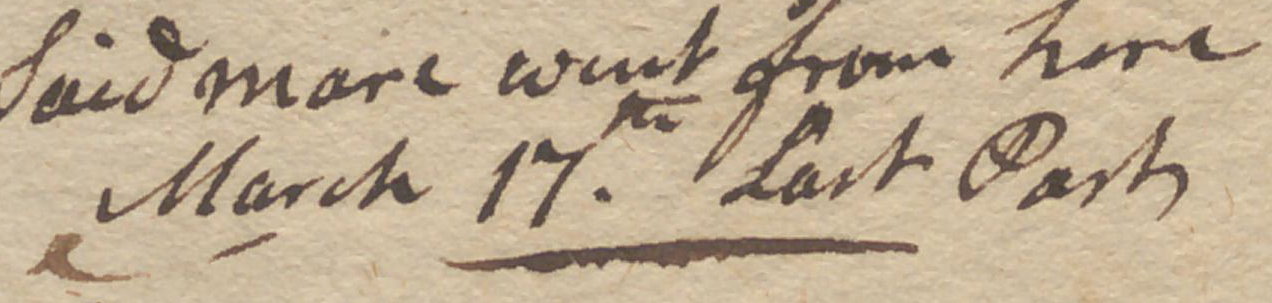March 17^th. Last Past
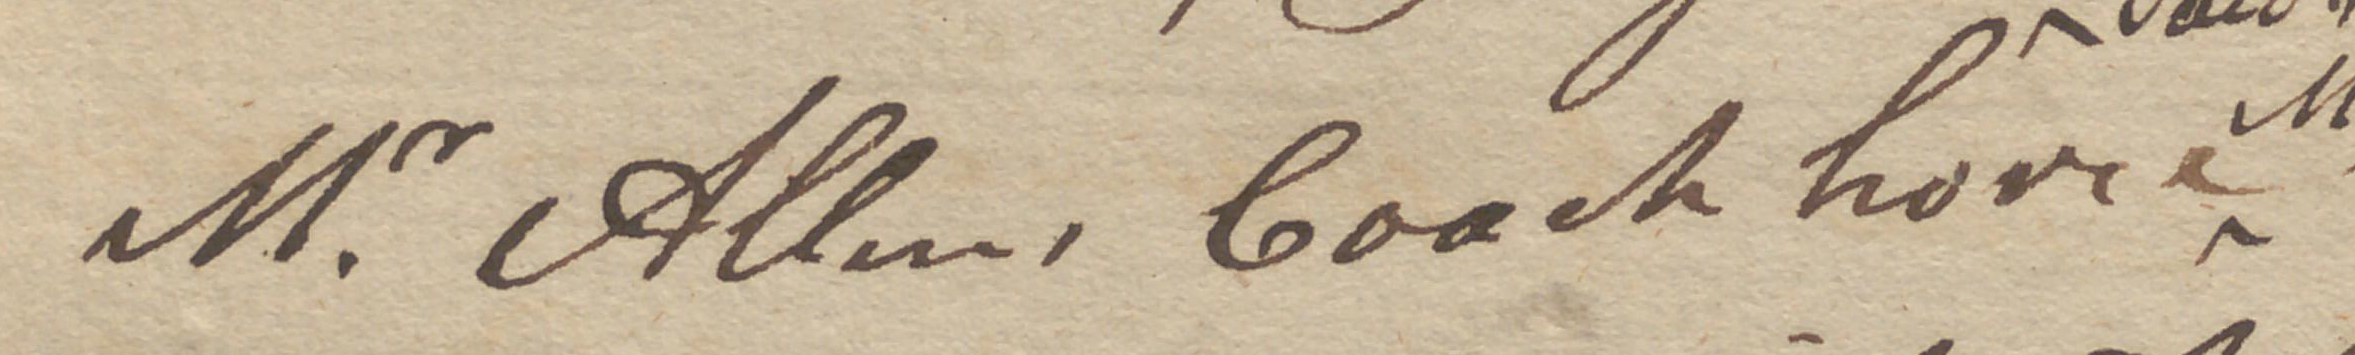M^r. Allens Coach horse ^
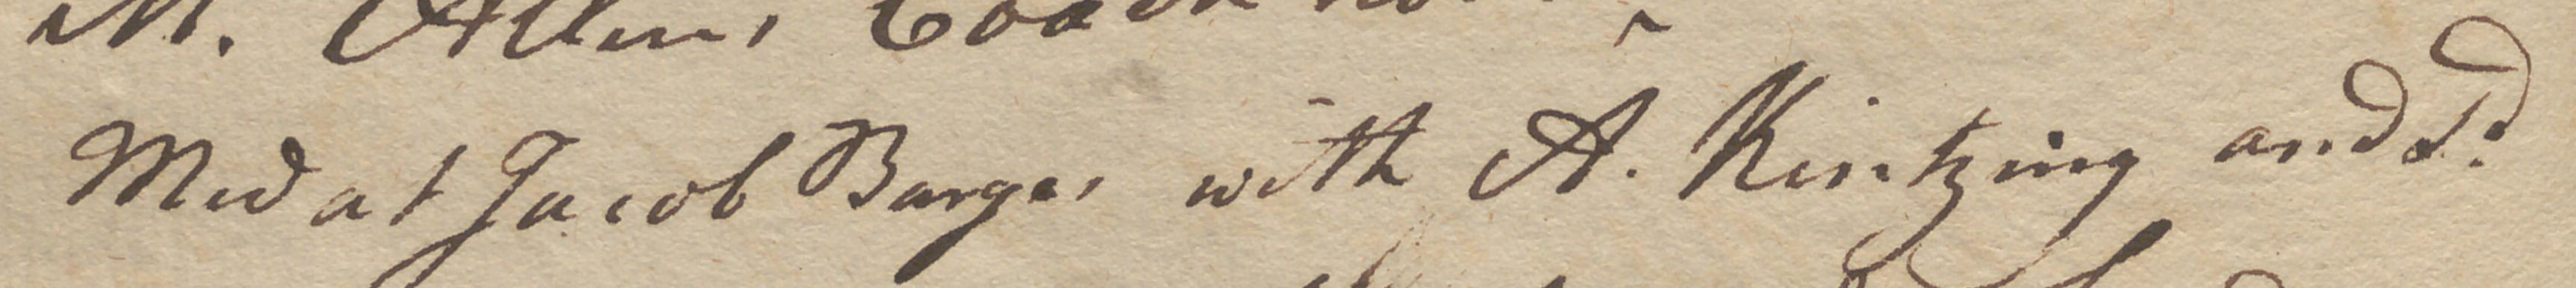Med at Jacob Barges with A. Kinitzing and s^d.
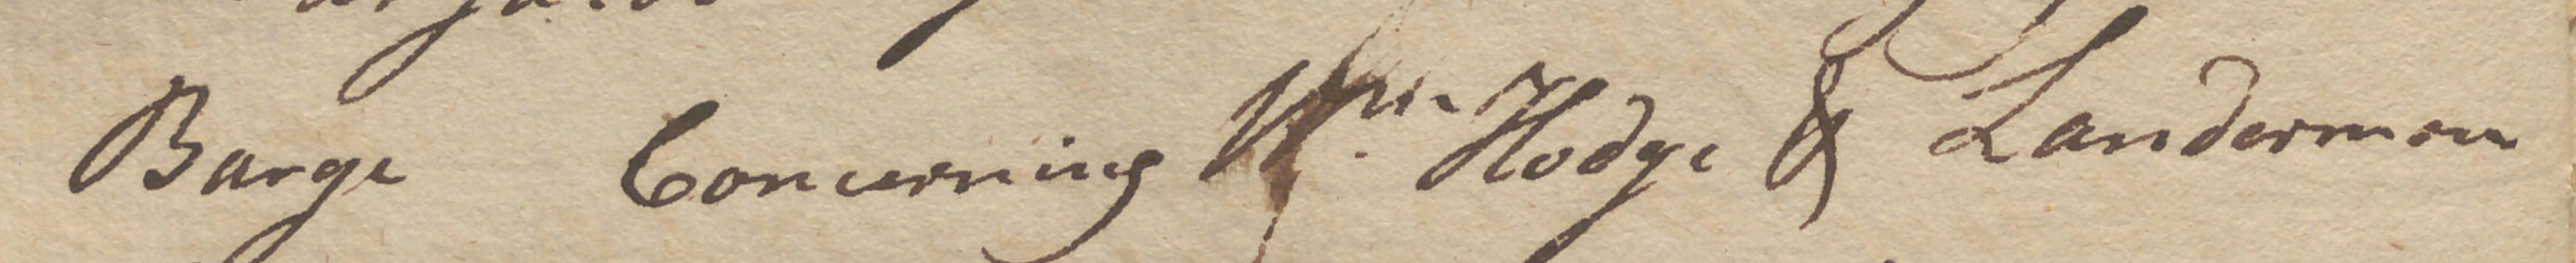Barge Concerning W^m. Hodge & Landerman
